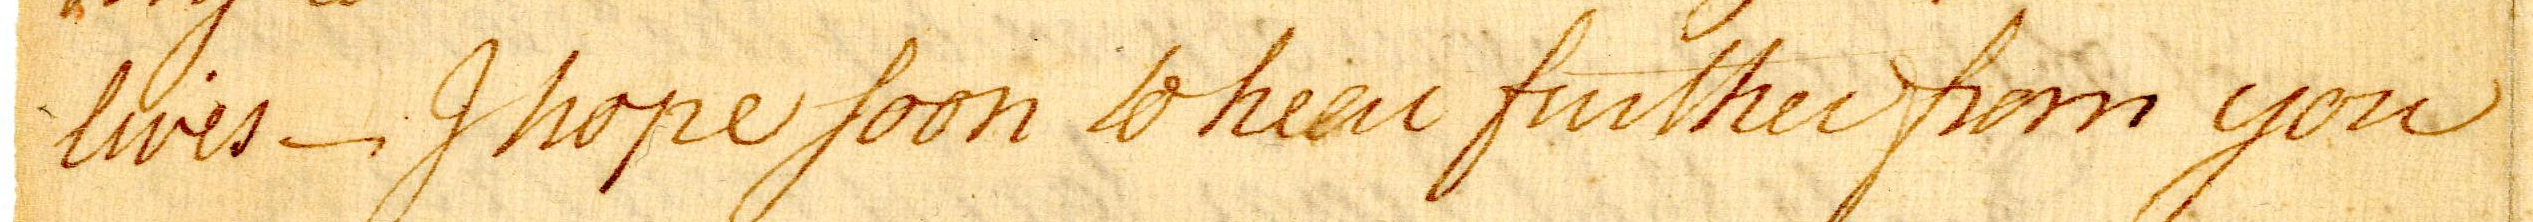lives- I hope soon to hear further from you
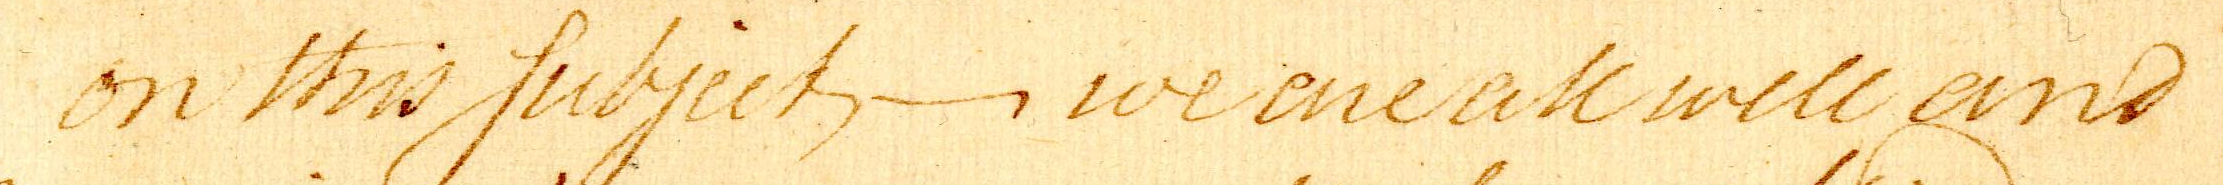on this Subject- we are all well and
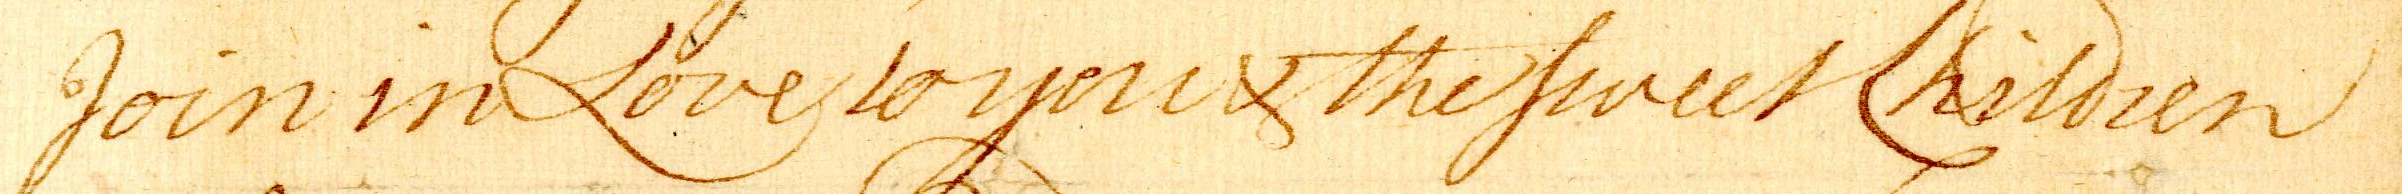Join in Love to you & the sweet Children
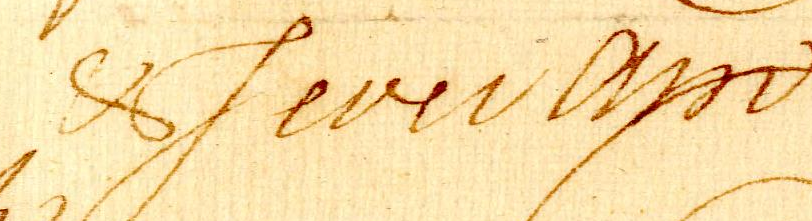& I ever am
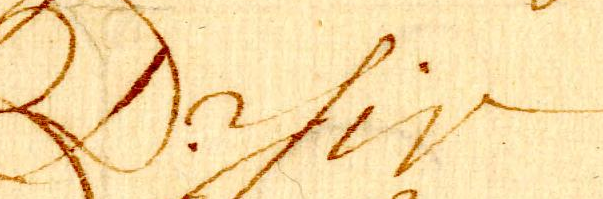D^r Sir
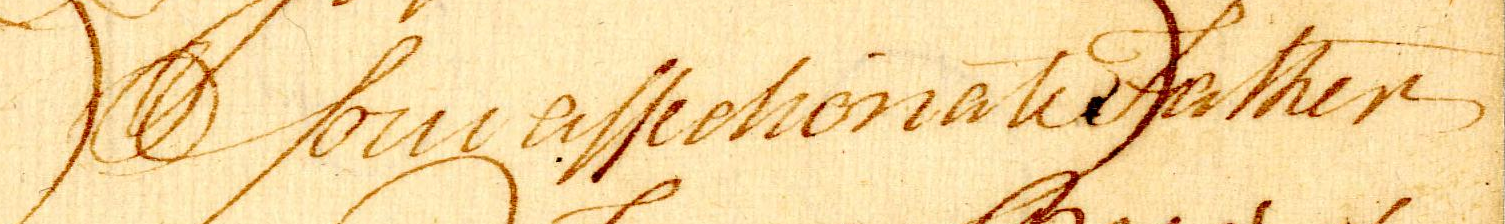Your affectionate father
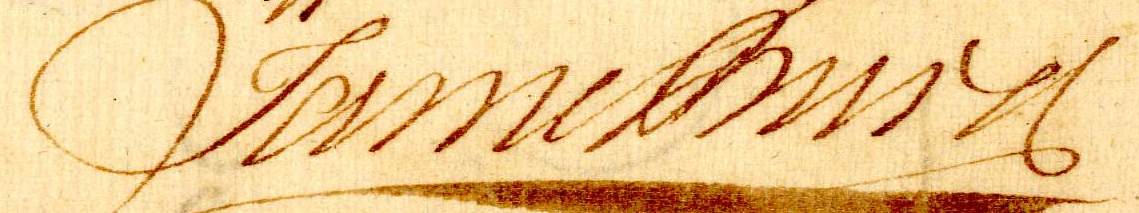James Burd
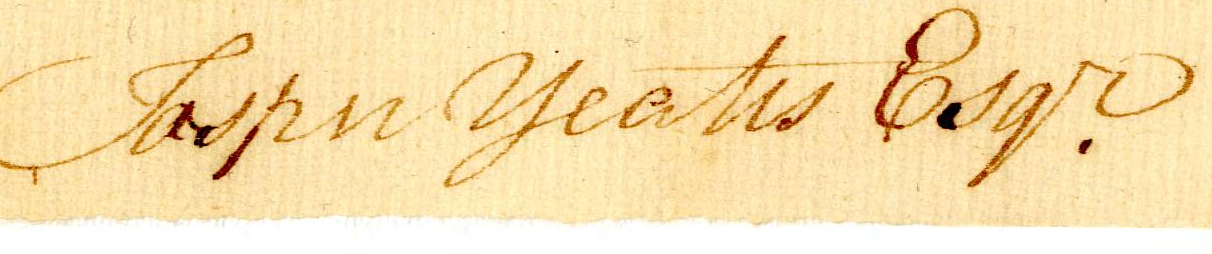Jasper Yeates Esq^r.
